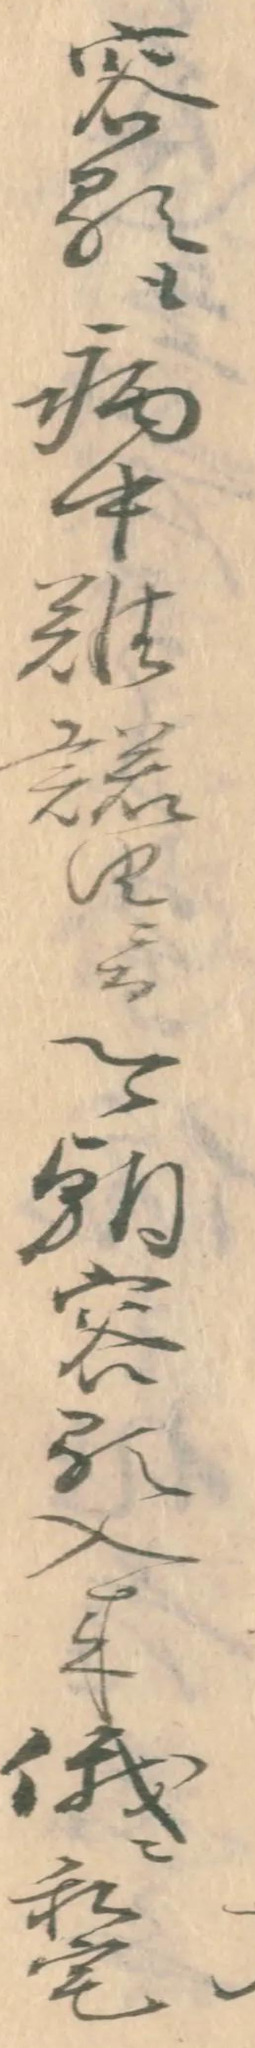容顕も病中難諾由ニ而今朝容敬顕入来儀ニ私宅
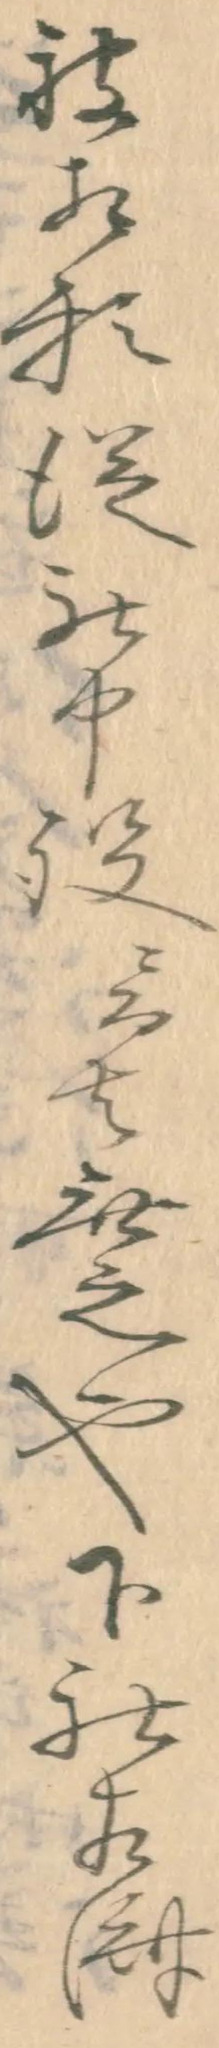被相頼従社中役ニ而は無之や下社相済
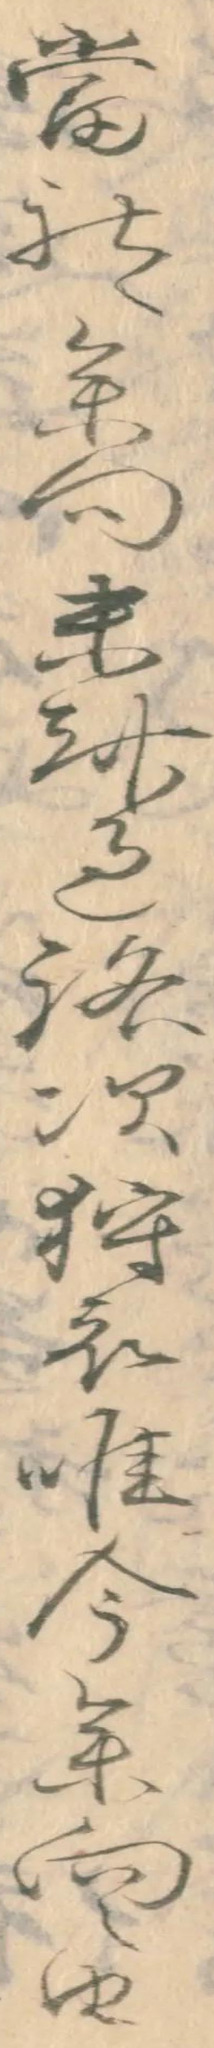当社参向未刻過路次狩衣唯今参向之由
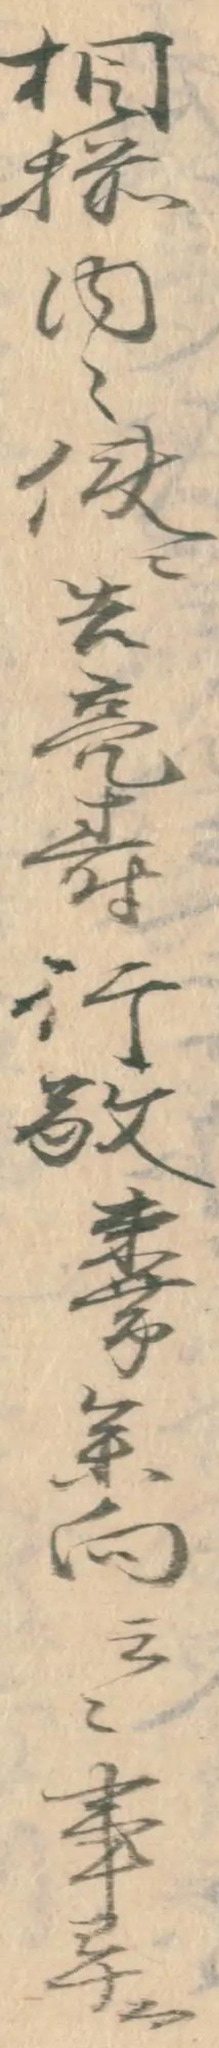相揃内々使に告亮寿行敬束帯参向云々事畢而
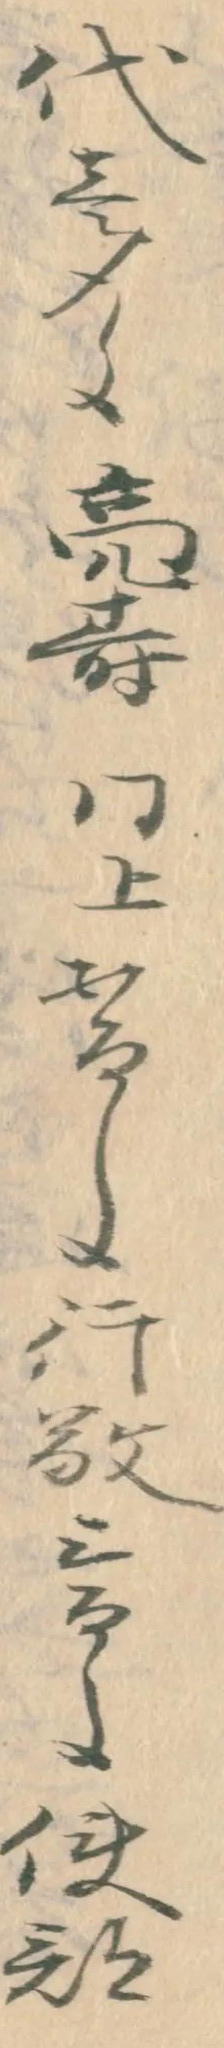代壱〆文亮寿五百文行敬三百文使部
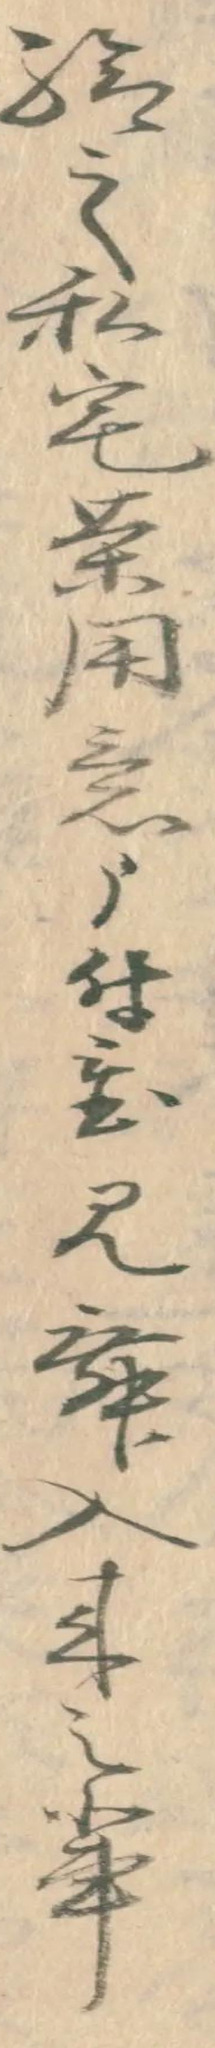給之私宅茶用意申付置見舞入来之輩
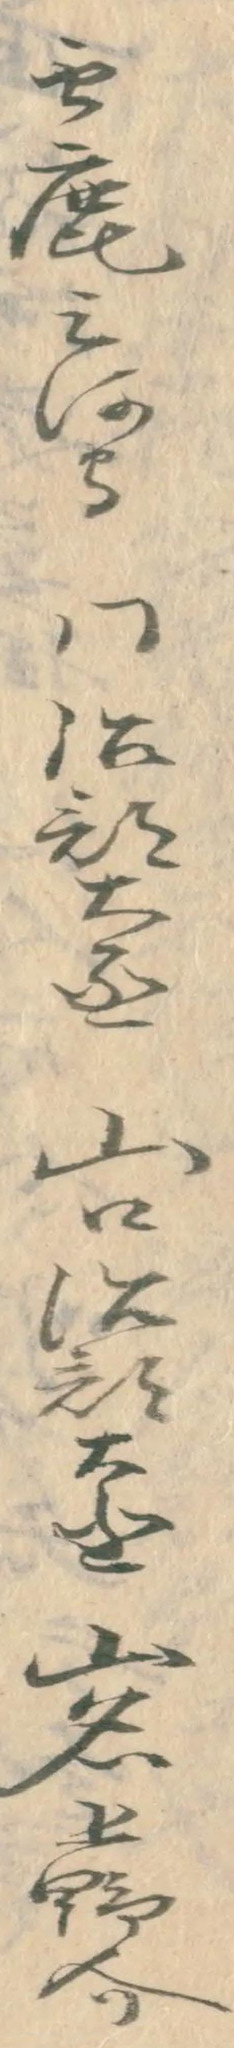虫鹿三河守同治部大丞山口治部大丞山名上野介
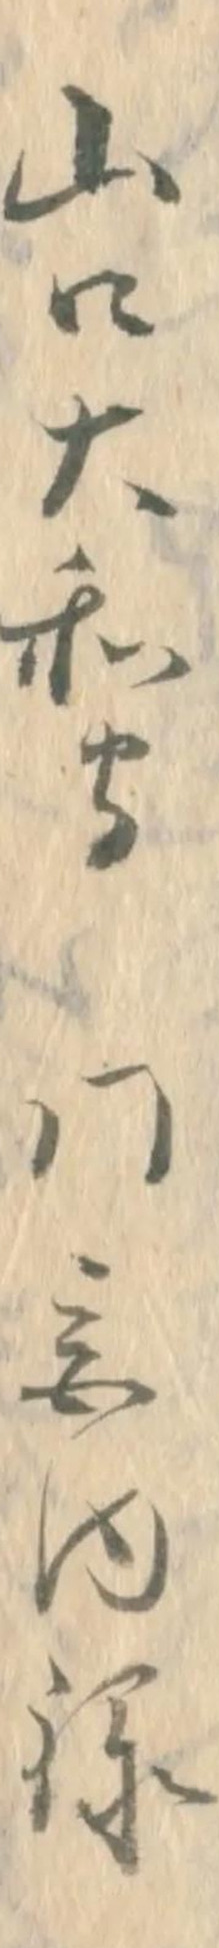山口大和守同宮内録
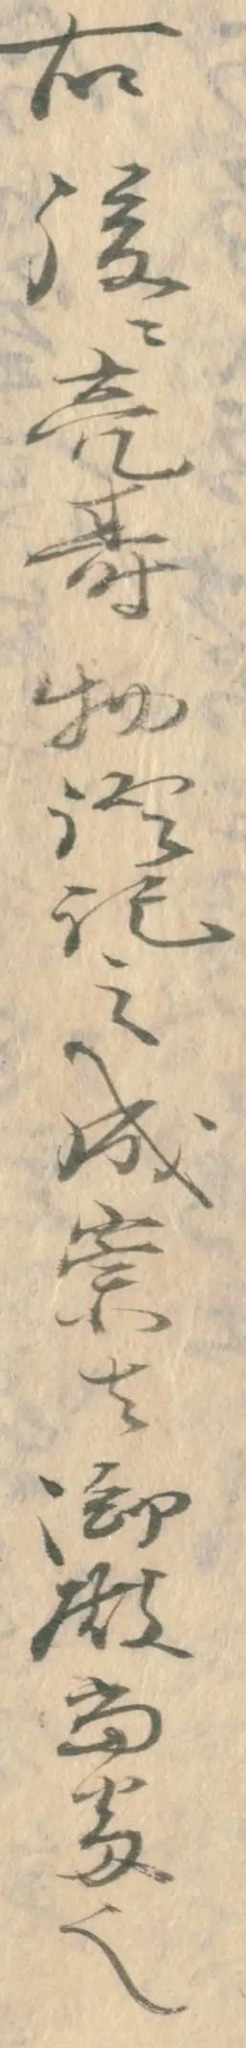右後に亮寿物語記之成崇は御殿当番也
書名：賀茂社記録. 第22冊
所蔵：国立国会図書館 National Diet Library, JAPAN
